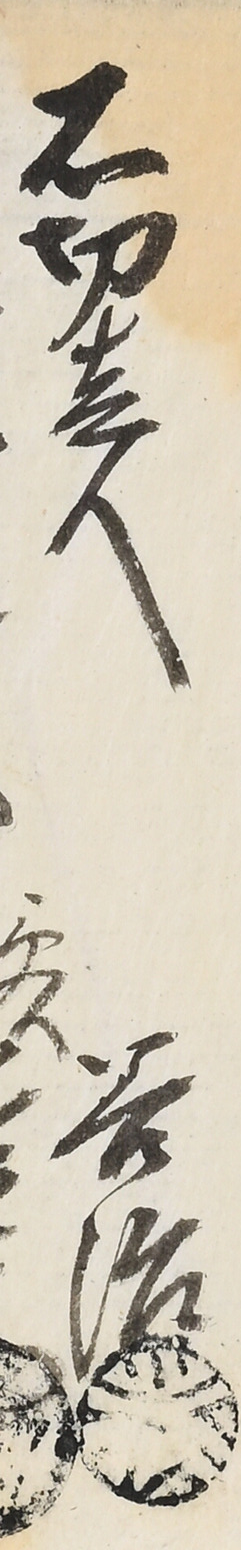石切壱人善治㊞
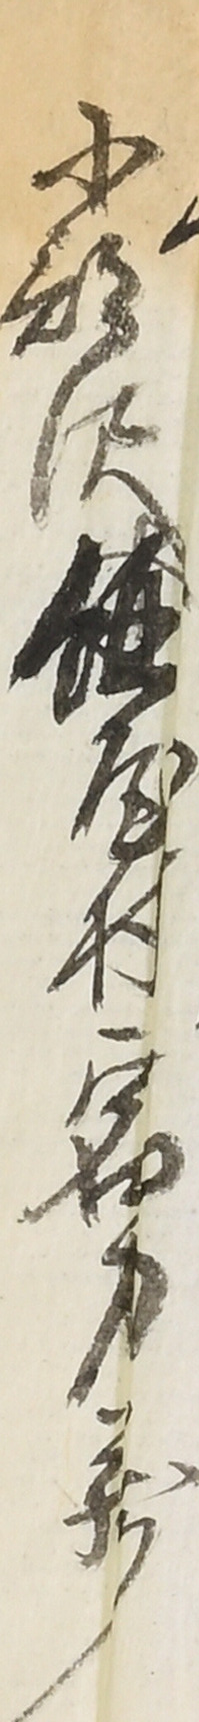小部沢紺屋村宿力蔵
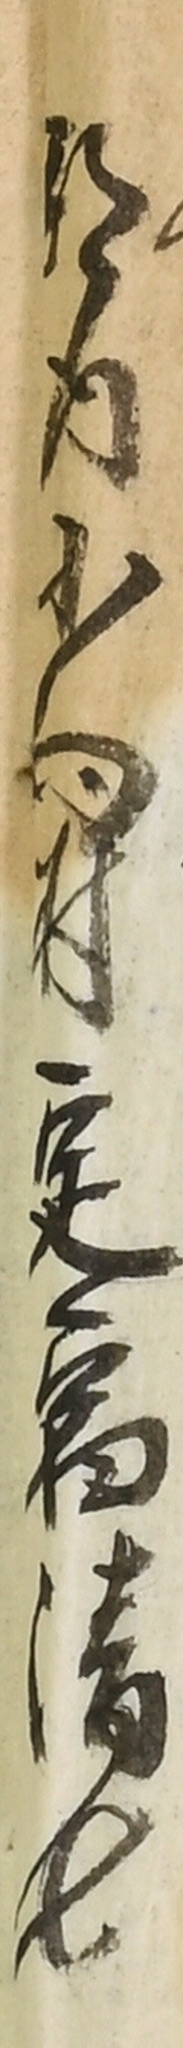郡内小向村定宿清七

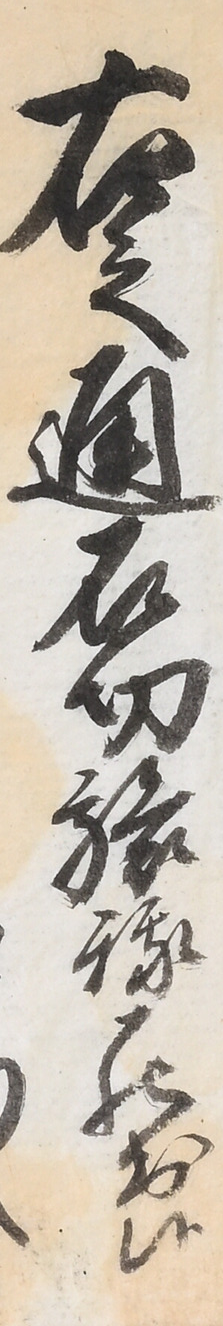右之通石切旅稼罷出候
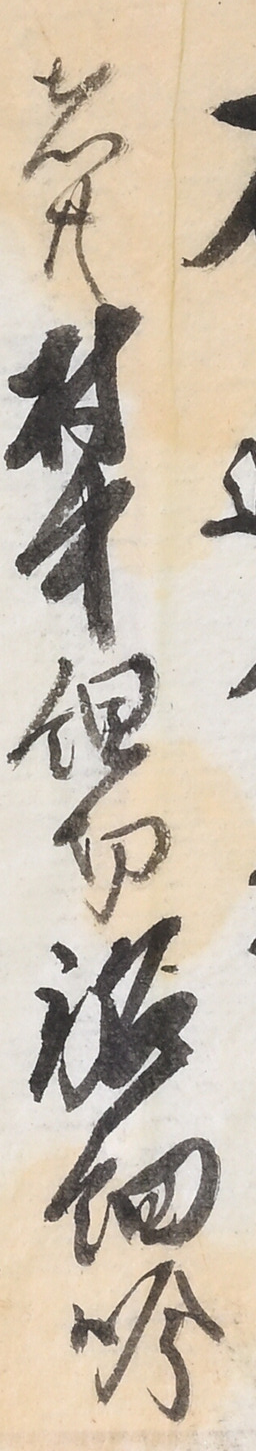者共村中組切銘細吟
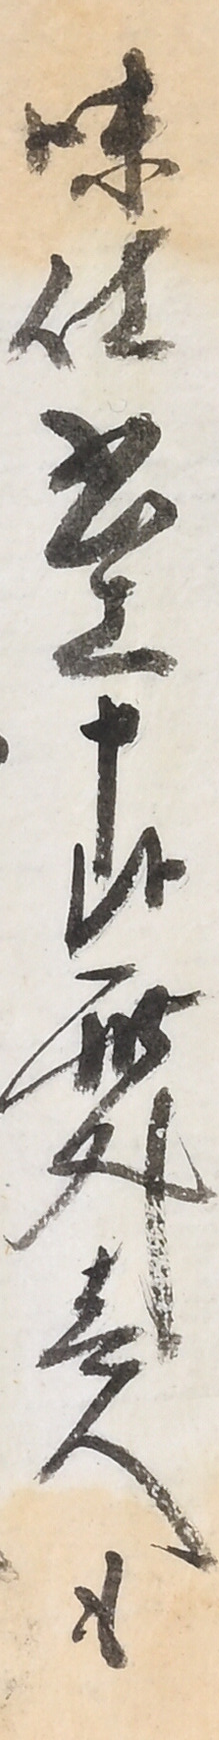味仕書上申候此外壱人も
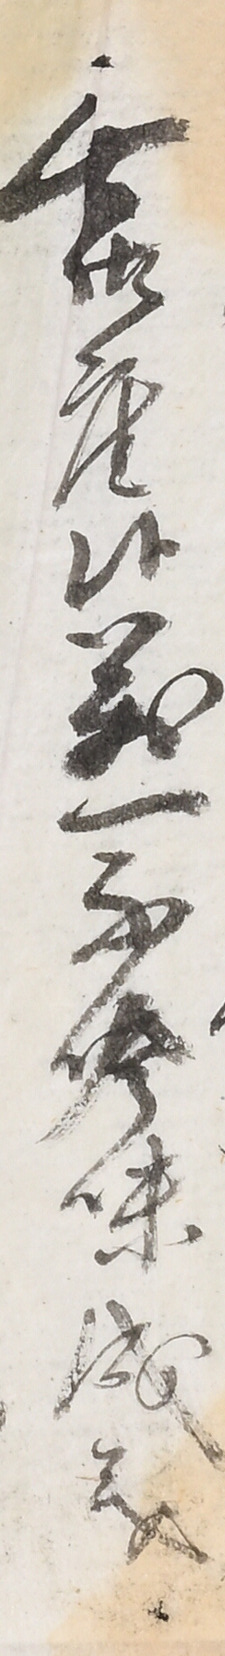無御座候万一不吟味成義
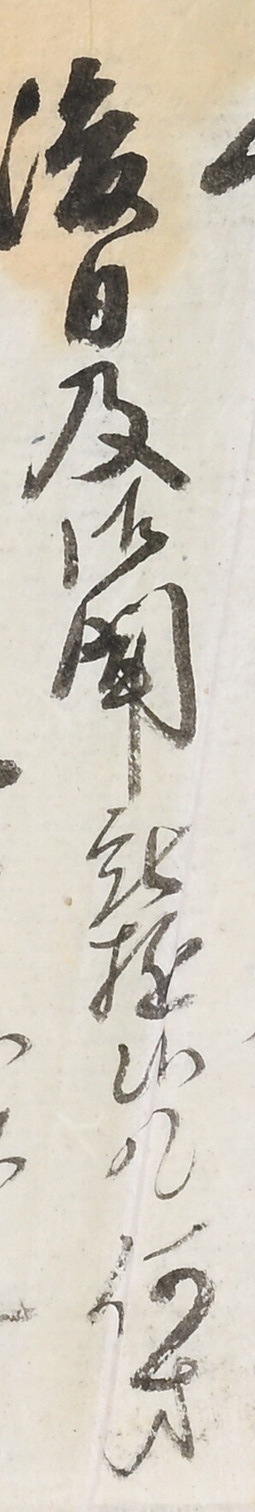後日及御聞被遊候ハヽ何方
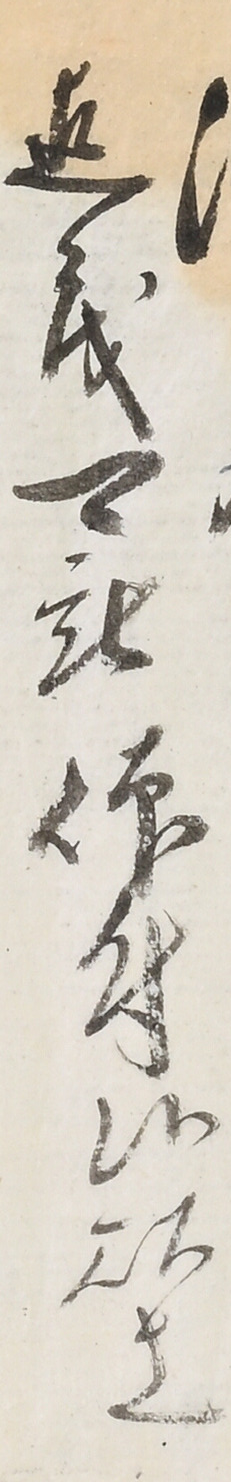迄も可被仰付候以上
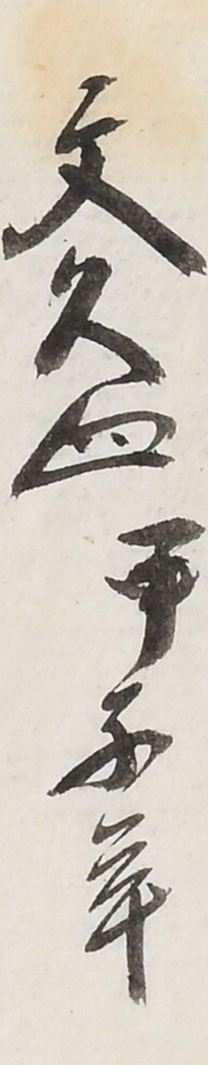文久四甲子年
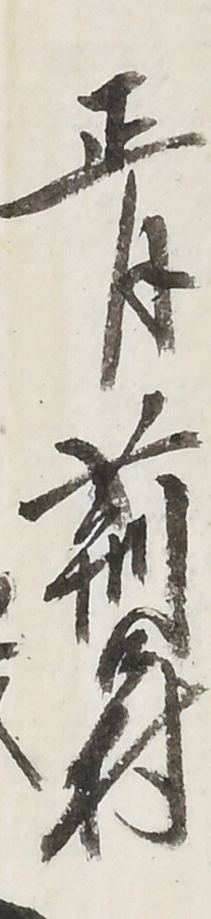正月荊口村
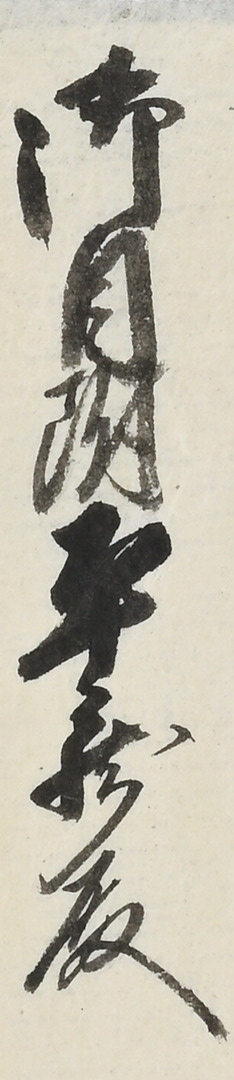御目附平蔵殿
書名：文久四甲子年正月他国出石切名前書上帳
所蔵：伊那市立高遠町図書館・合同会社AMANE
